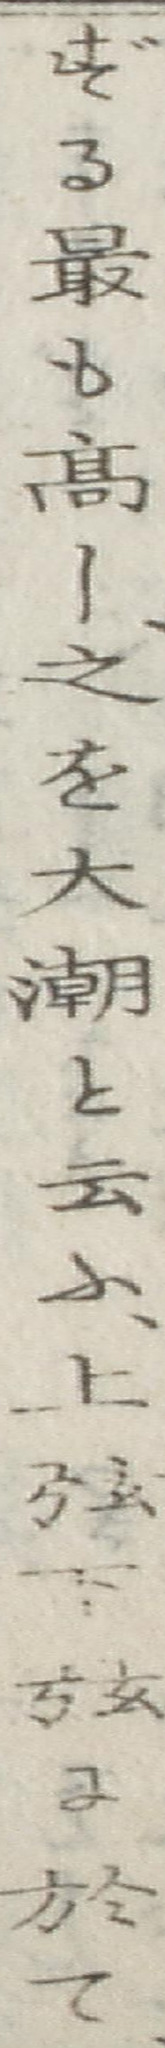ずる最も高し、之を大潮と云ふ、上弦下弦に於て、
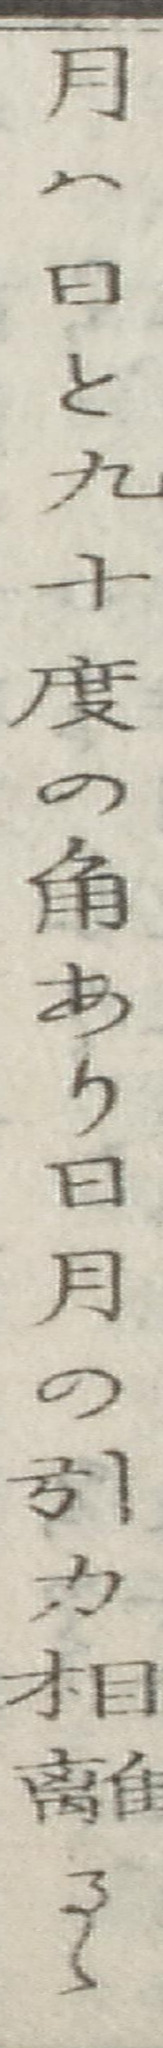月は日と九十度の角あり、日月の引力相離るゝ
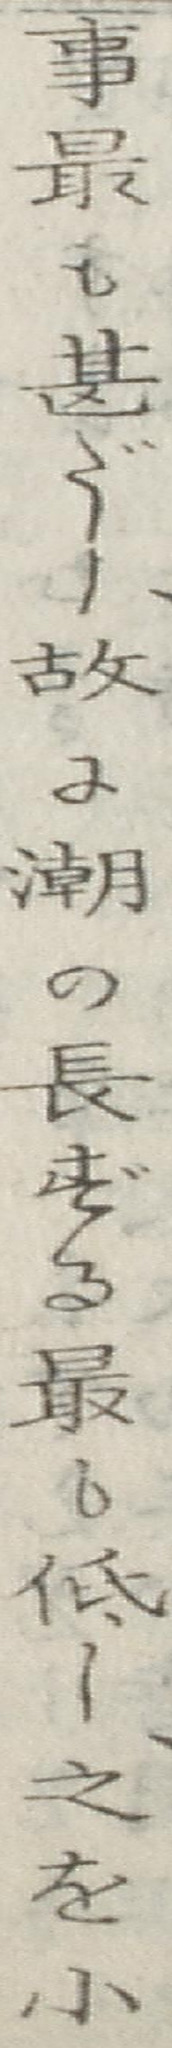事最も甚だし、故に潮の長する最も低し、之を小
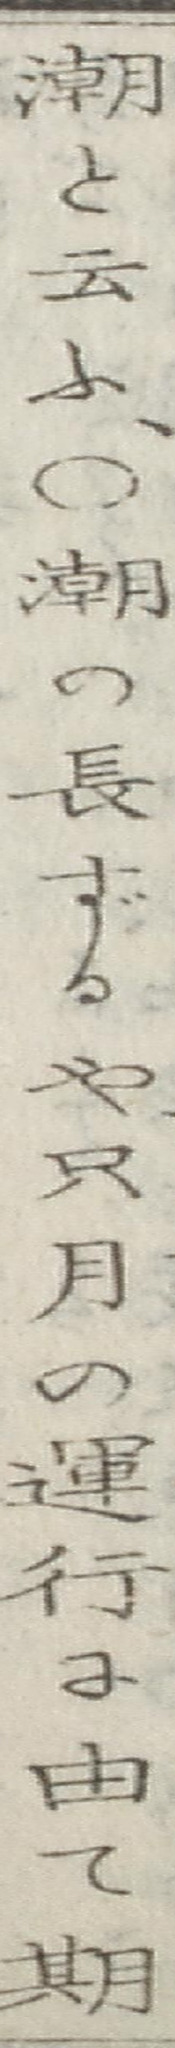潮と云ふ、〇潮の長ずるや、只月の運行に由て期
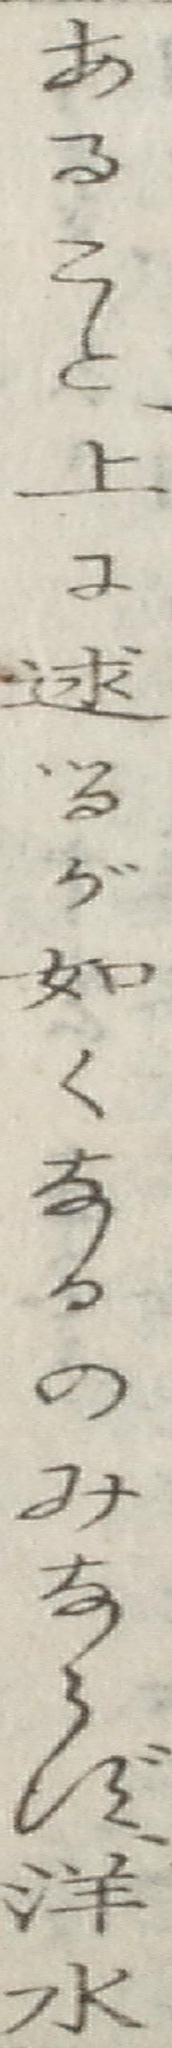あること、上に述るが如くなるのみならず、洋水
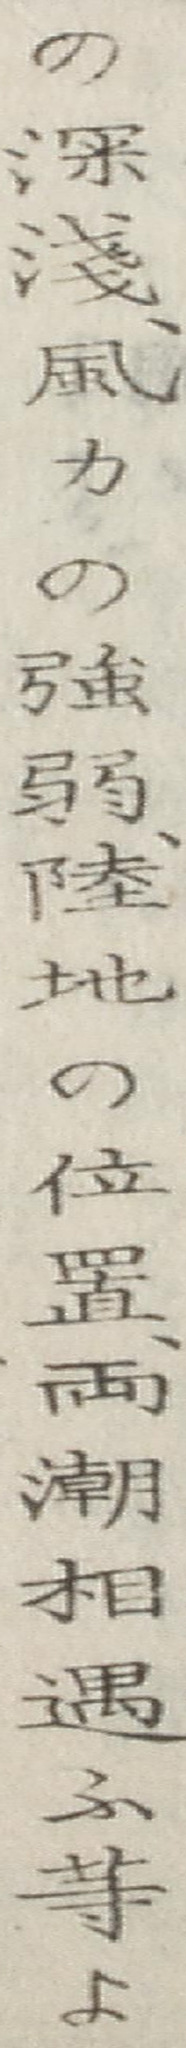の深浅、風力の強弱、陸地の位置、両潮相遇ふ等よ
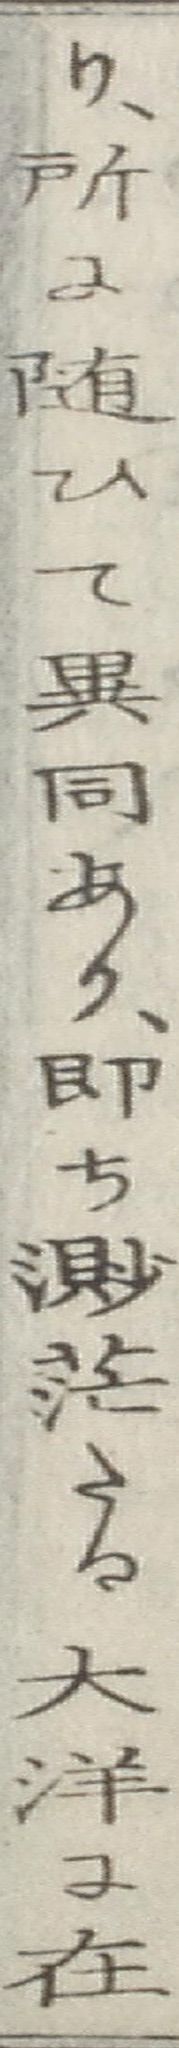り、所に随ひて異同あり、即ち渺茫たる大洋に在
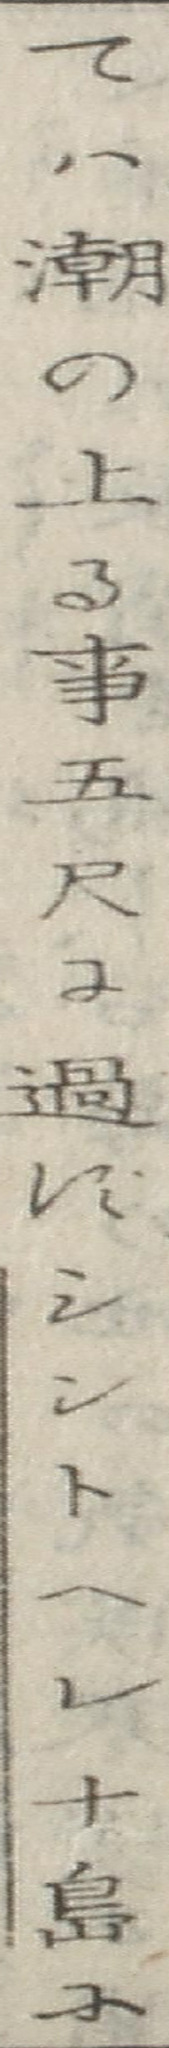ては、潮の上る事五尺に過ず、シントヘレナ島に
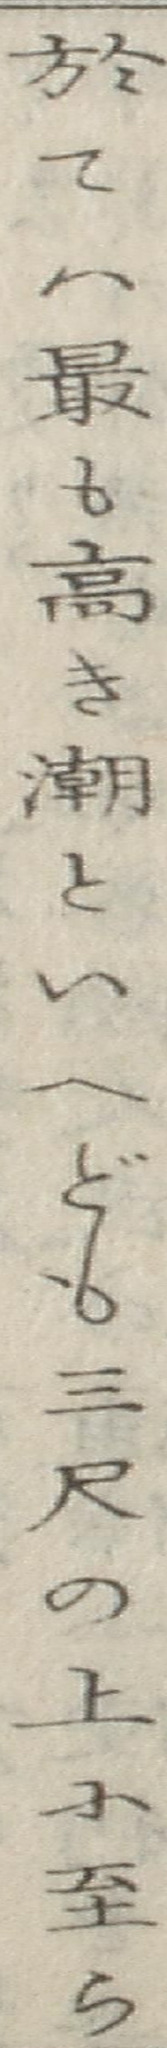於ては最も高き潮といへども、三尺の上に至ら
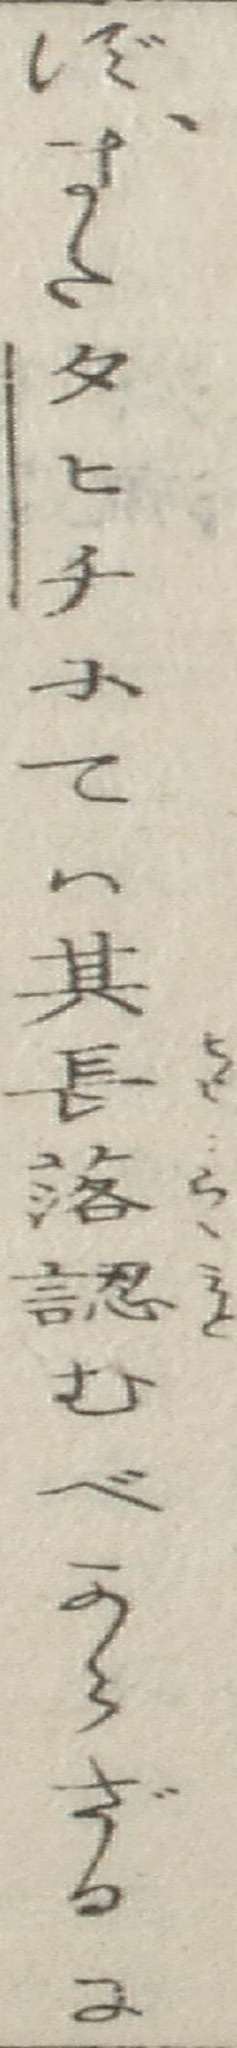ず、またタヒチにては其長落認むべからざるに
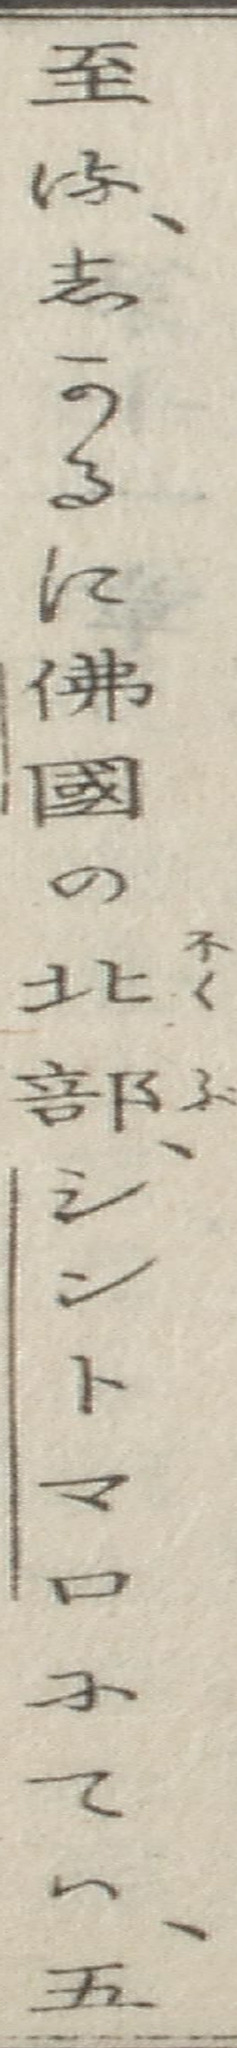至る、しかるに仏国の北部、シントマロにては、五
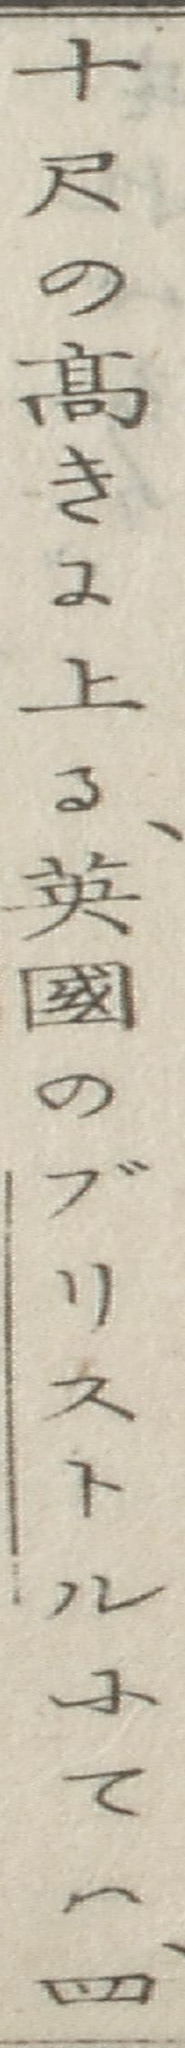十尺の高きに上る、英国のブリストルにては、四
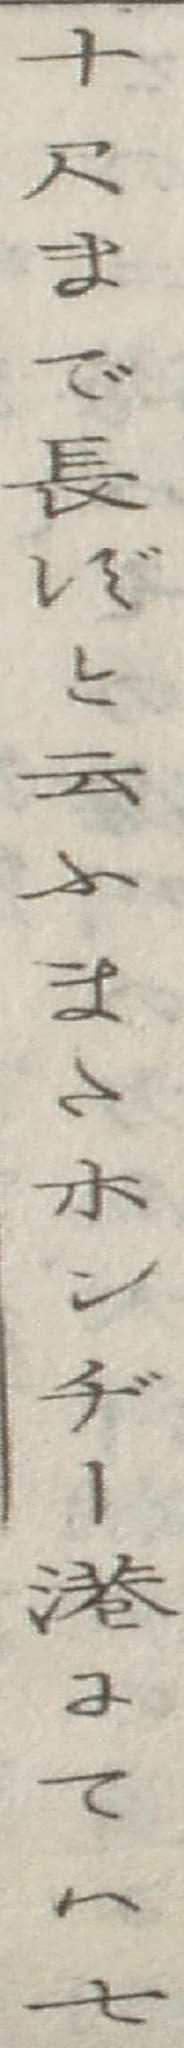十尺まで長ずと云ふまたホンヂー港にては七
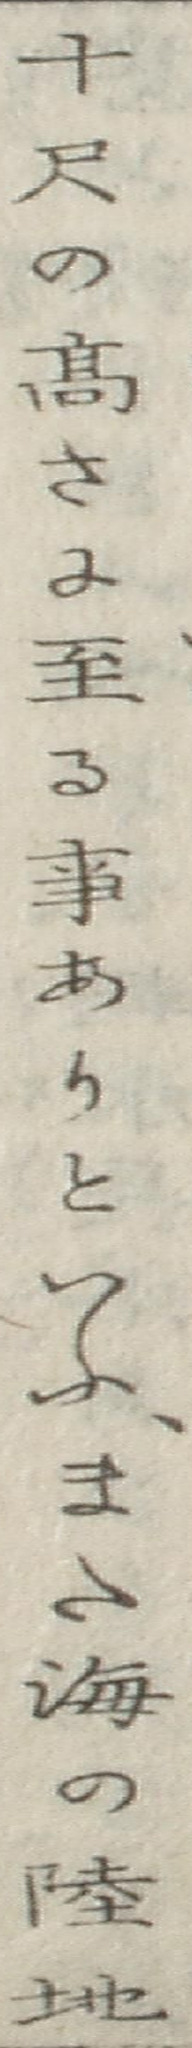十尺の高さに至る事ありといふ、また海の陸地
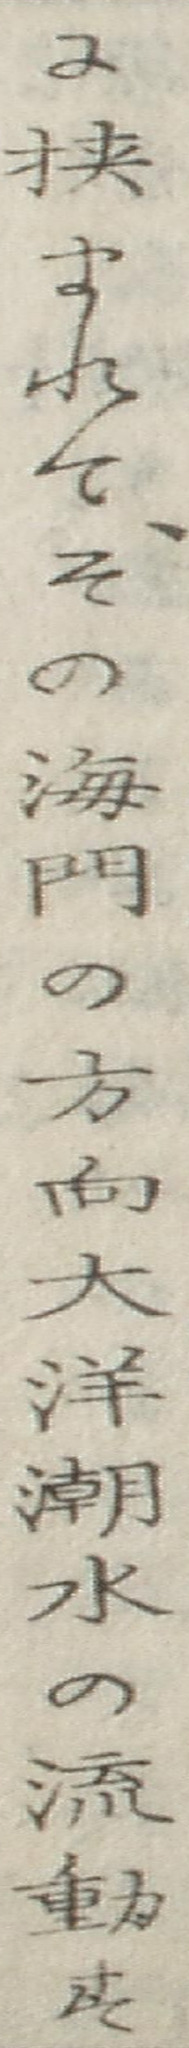に挟まれて、その海門の方向大洋潮水の流動す
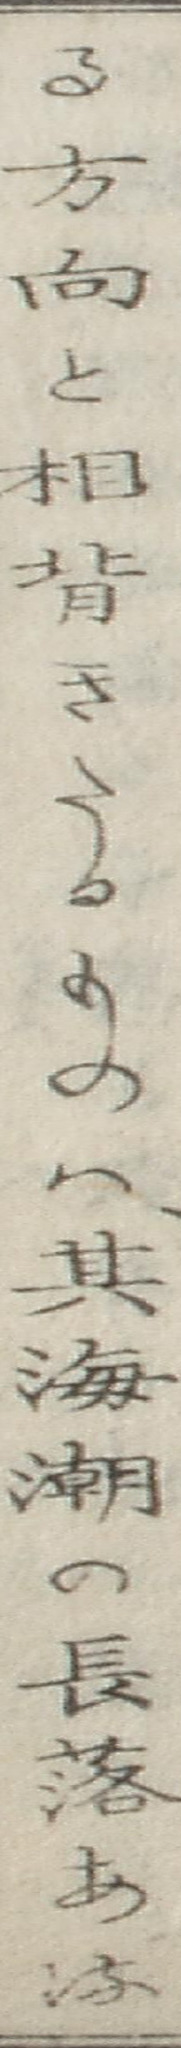る方向と相背きたるものは、其海潮の長落ある
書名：訓蒙　天然地理學　中
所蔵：東京大学地震研究所図書室 Earthquake Research Institute Library, The University of Tokyo, JAPAN
